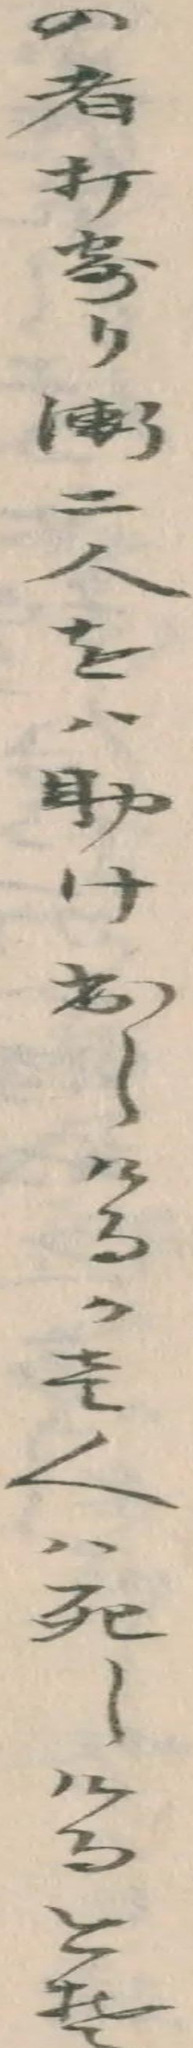の者打寄り漸二人をは助け出しけるか壱人は死しけるとそ
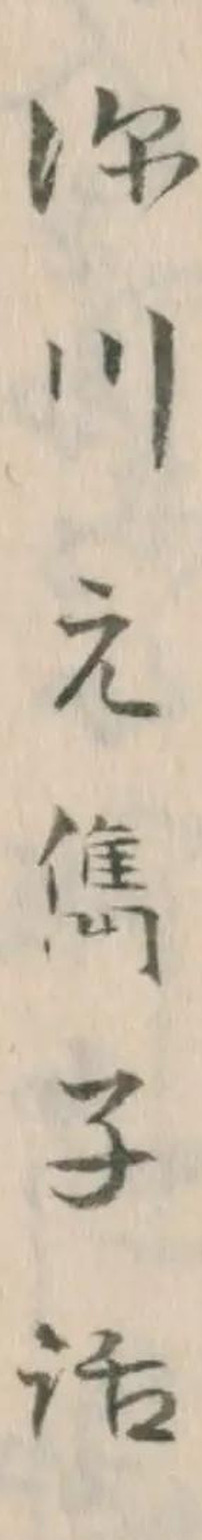深川元儁子話
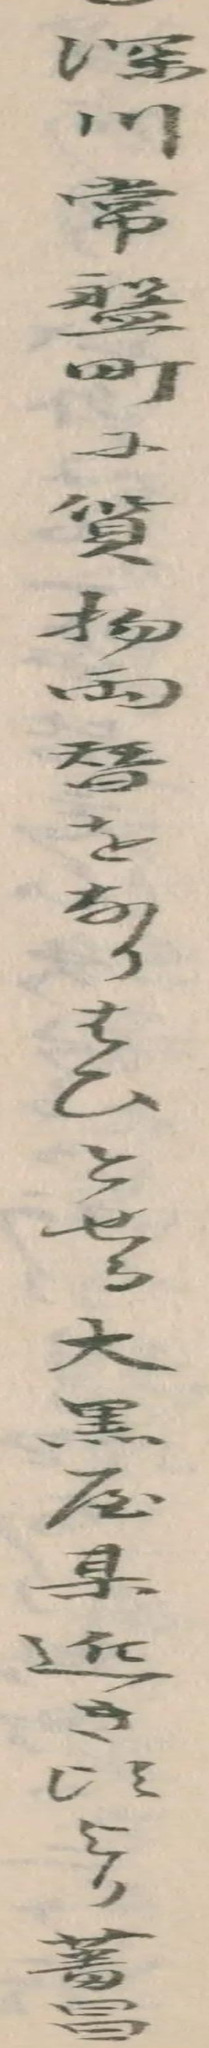〇深川常盤町に貨物両替をなりはひとせる大黒屋某近き頃より蕃昌
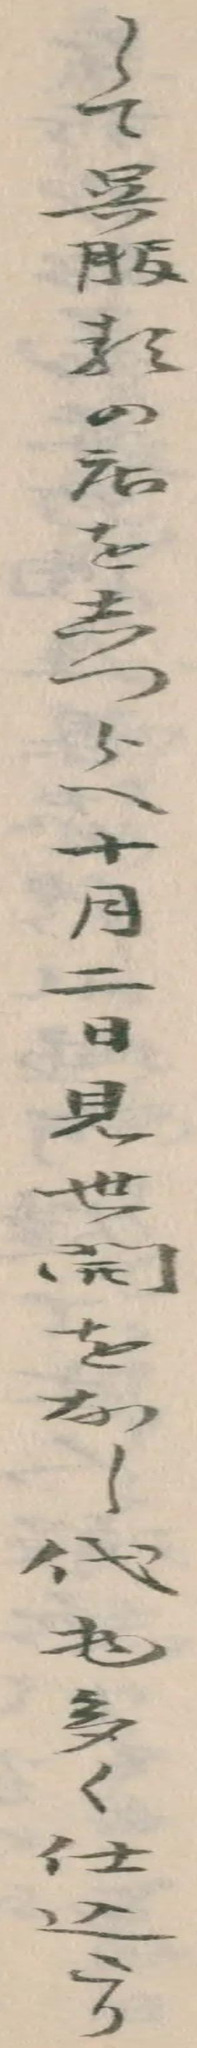して呉服類の店をしつらへ十月二日見世開をなし代物多く仕込たり
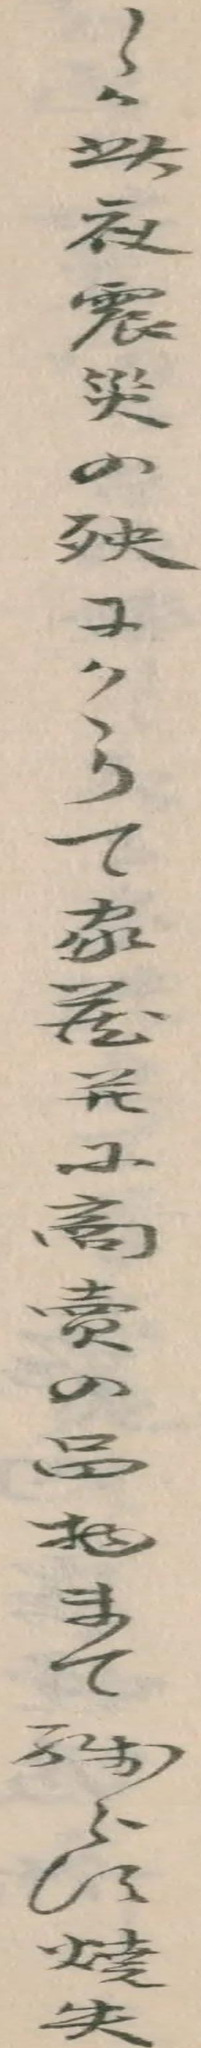しか此夜震災の殃にかゝりて家蔵并に商売の品物まて残らす焼失
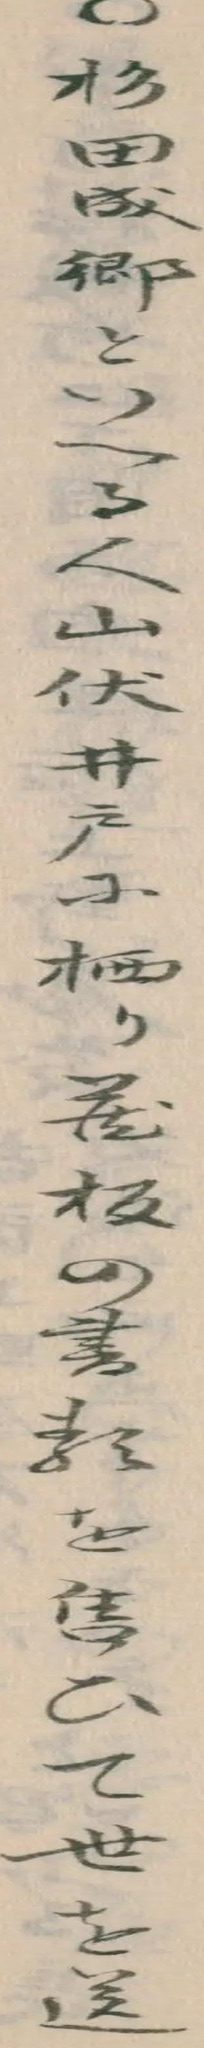〇杉田成郷といへる人山伏井戸に栖り蔵板の書類を售ひて世を送
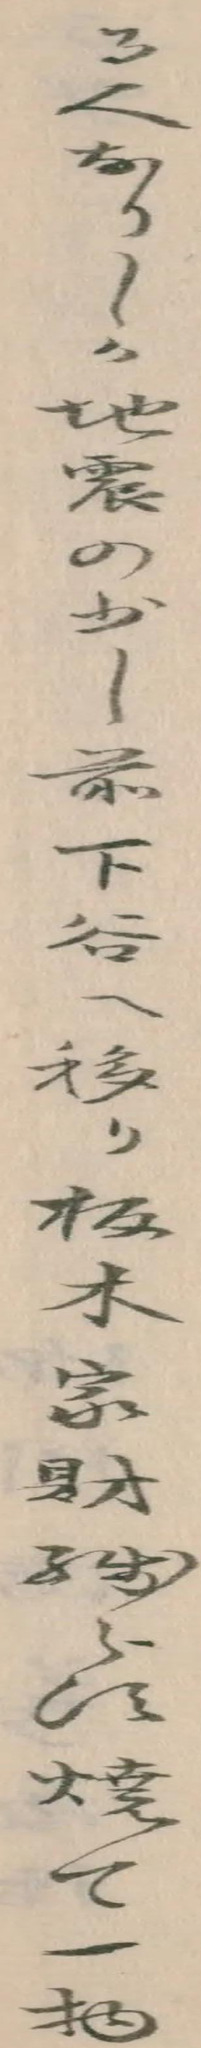る人なりしか地震の少し前下谷へ移り板木家財残らす焼て一物
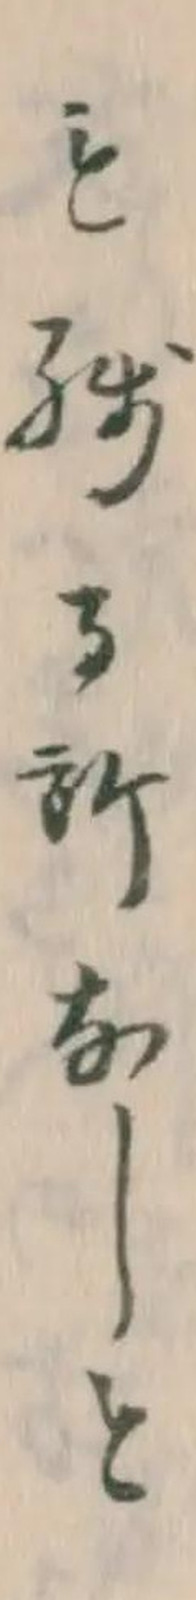も残る所なしと
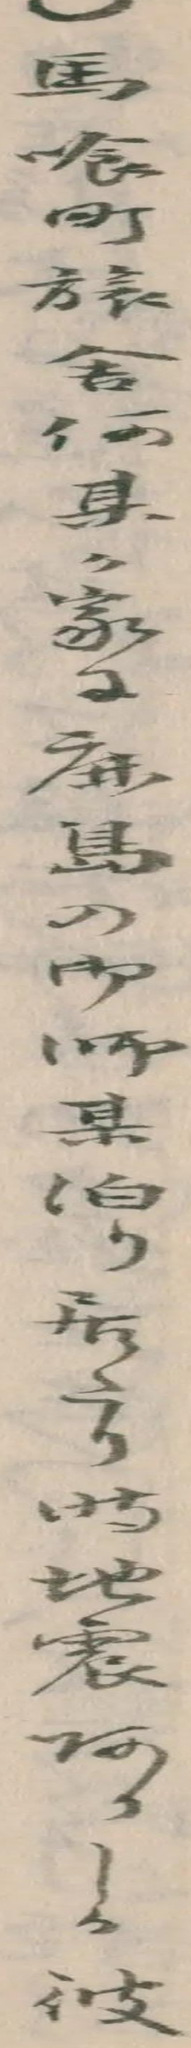〇馬喰町旅舎何某か家に鹿島の御師某泊り居たり時地震ありしか彼
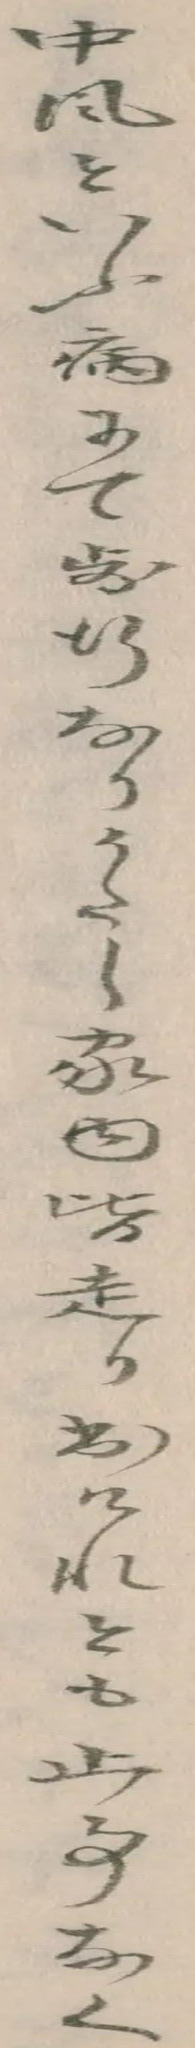中風といふ病にて歩行なりかたし家内皆走り出けれとも止事なく
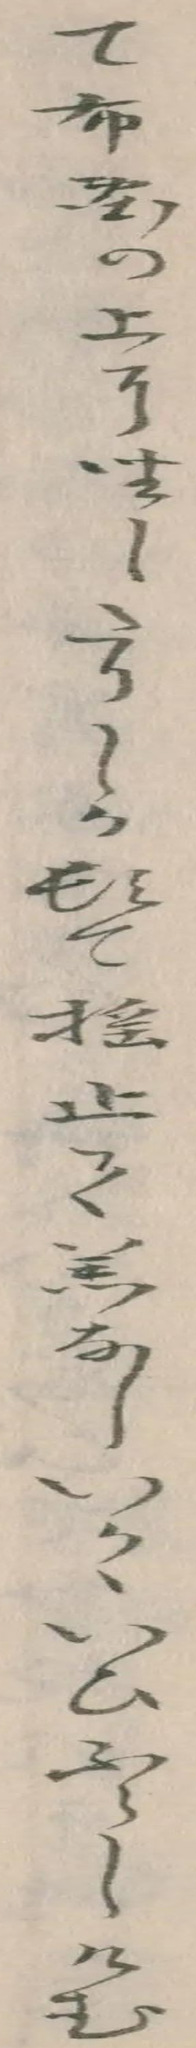て布団の上に坐したりしか頓て揺止て恙なしいかゝいひふらしけむ
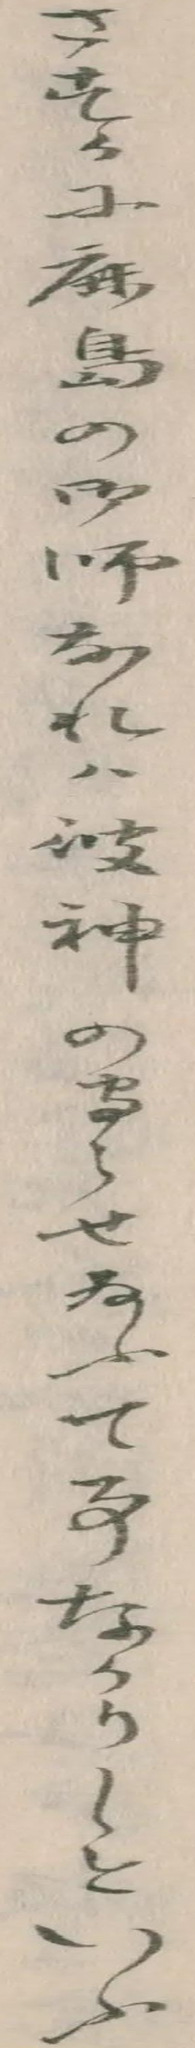さすかに鹿島の御師なれは彼神の守らせ給ふて事なかりしといふ
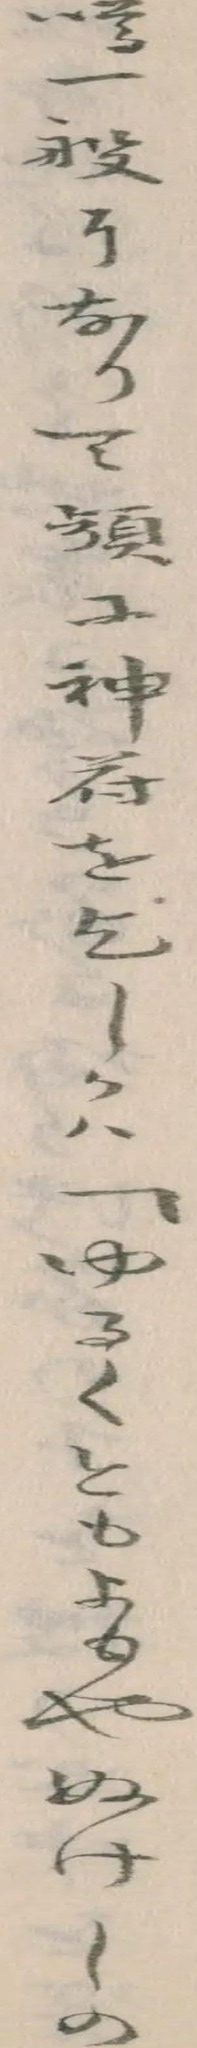噂一般になりて頻に神符を乞しかは「ゆるくともよもやぬけしの
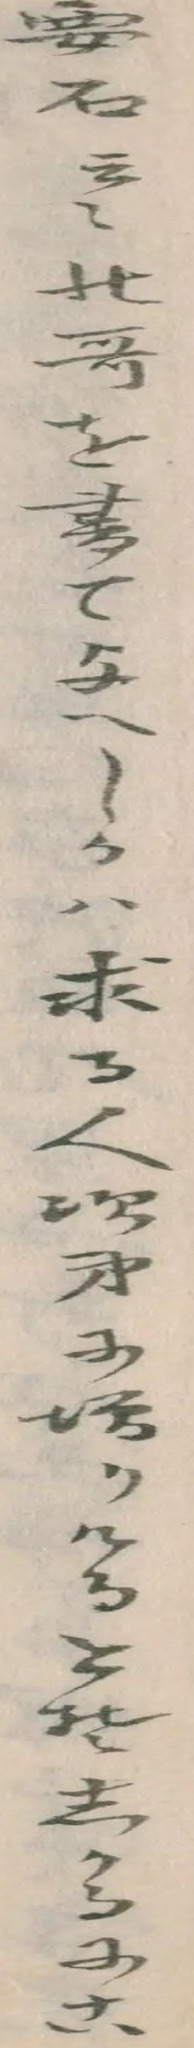要石云々の哥を書て与へしかは求る人次第に増りけるとそしかるにこ
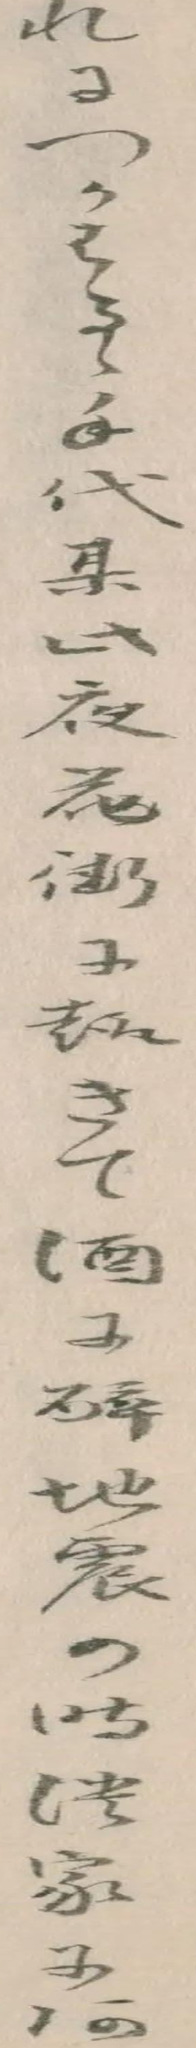れにつかはるゝ手代某此夜花街に趣きて酒に酔地震の時潰家にあ
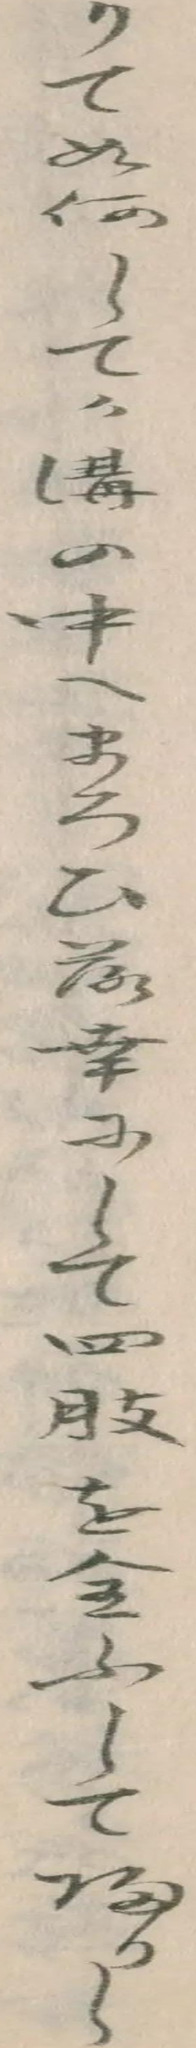りて如何してか溝の中へまろひ落幸にして四肢を全ふして帰りし
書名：地災撮要. 巻7-9(地震之部)
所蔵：国立国会図書館 National Diet Library, JAPAN
